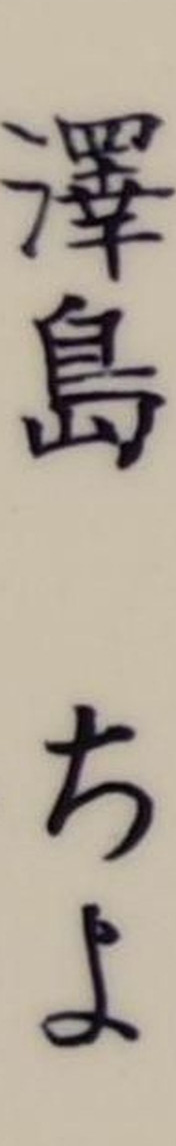澤島ちよ
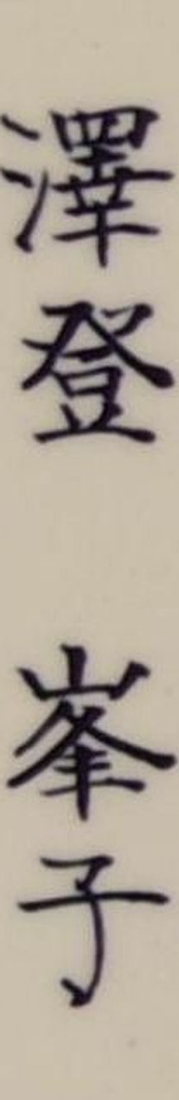澤登峯子
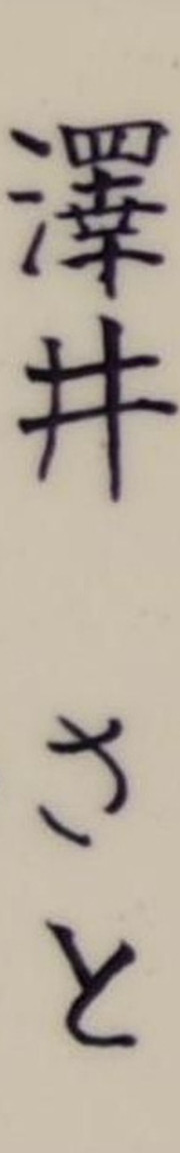澤井さと
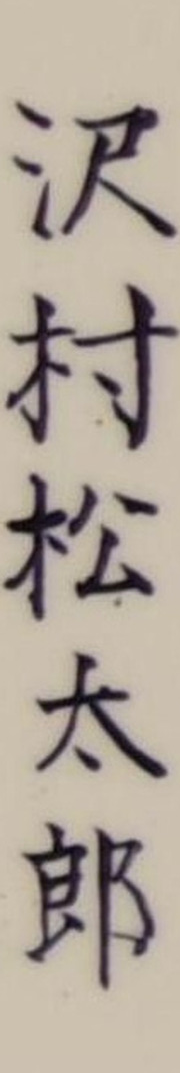沢村松太郎

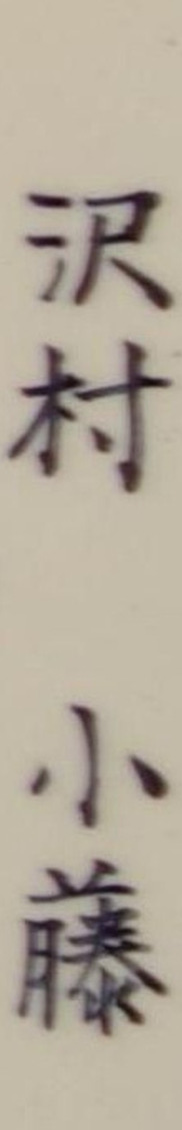沢村小藤
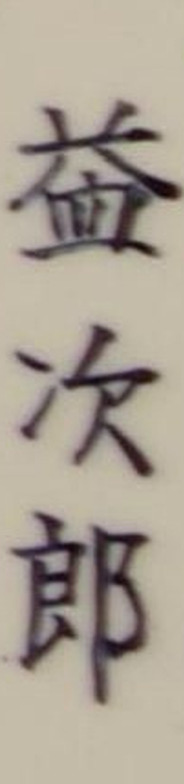益次郎
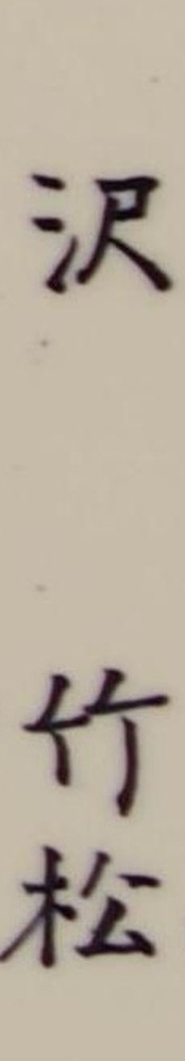沢竹松
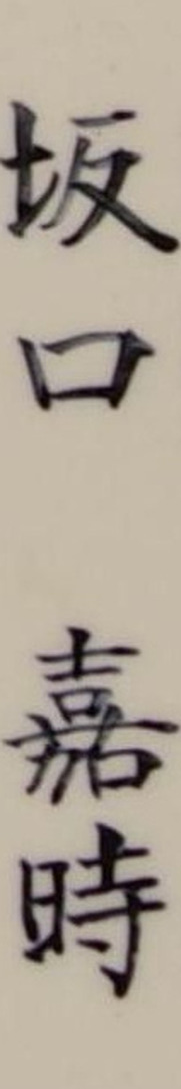坂口嘉時
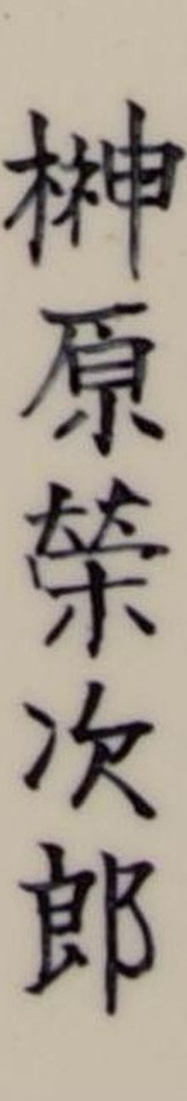榊原榮次郎
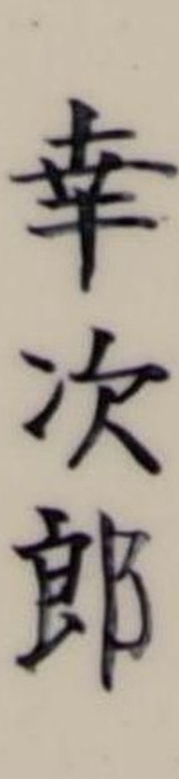幸次郎
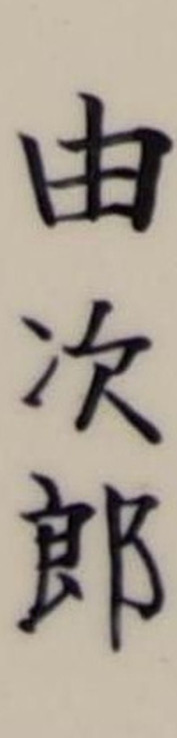由次郎
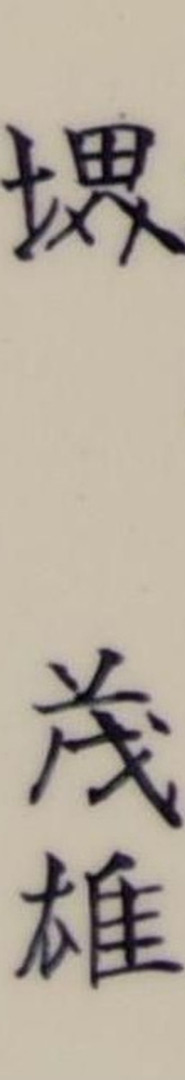堺茂雄
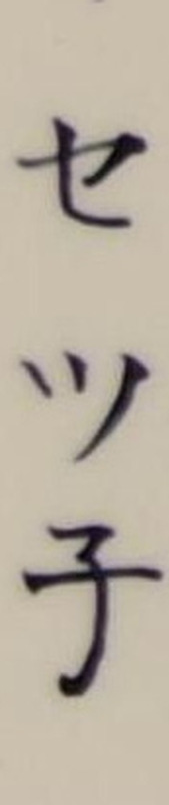セツ子
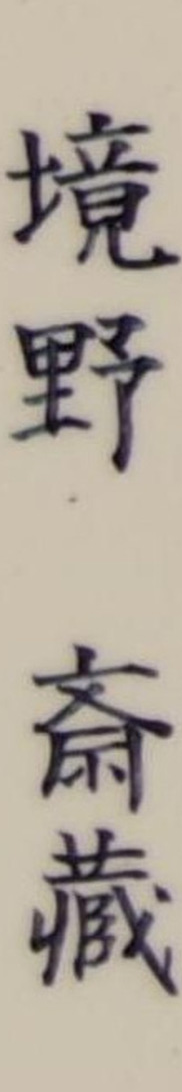境野斎蔵

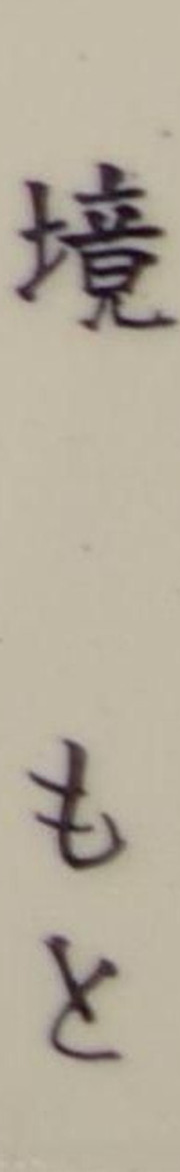境もと
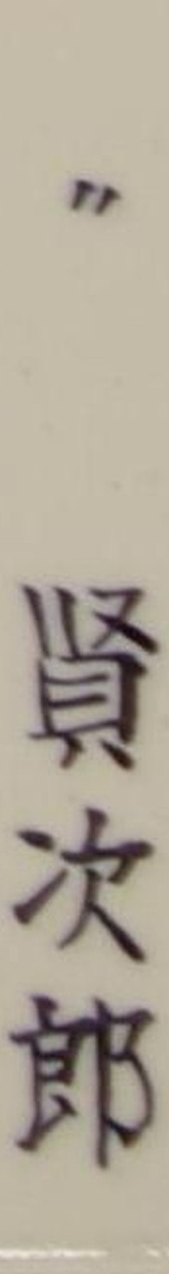賢次郎
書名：E~L
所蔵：高野山金剛峯寺
